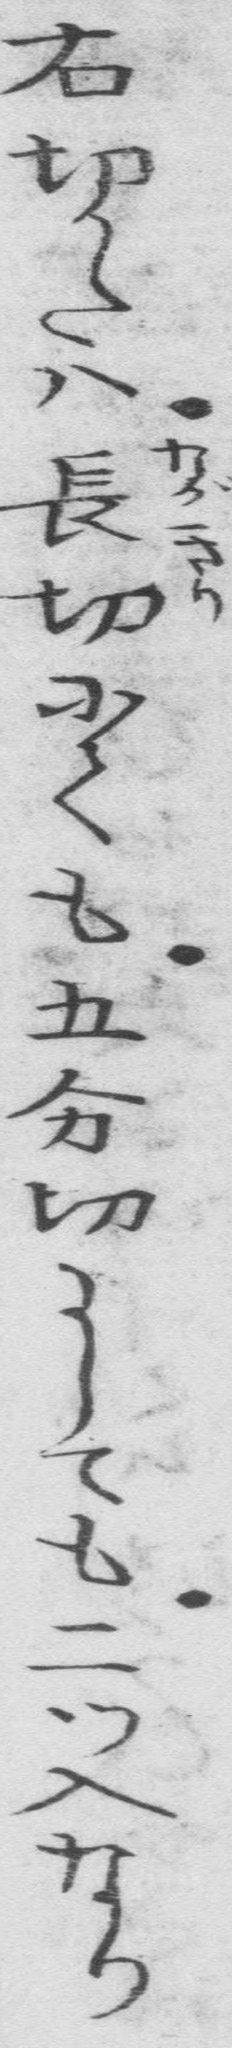右切かたは。長切にても。五分切にしても。二つ入なり
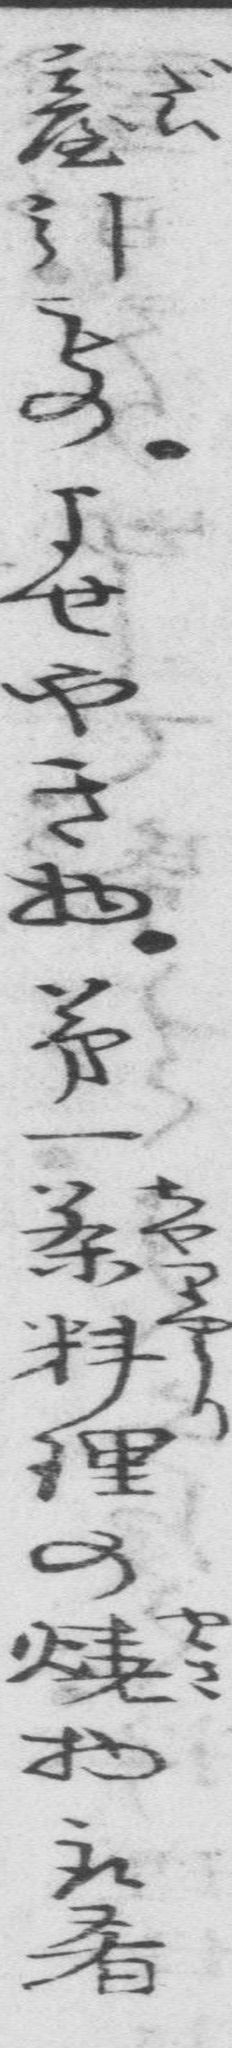台引もの。よせやき物。第一茶料理の焼物取肴
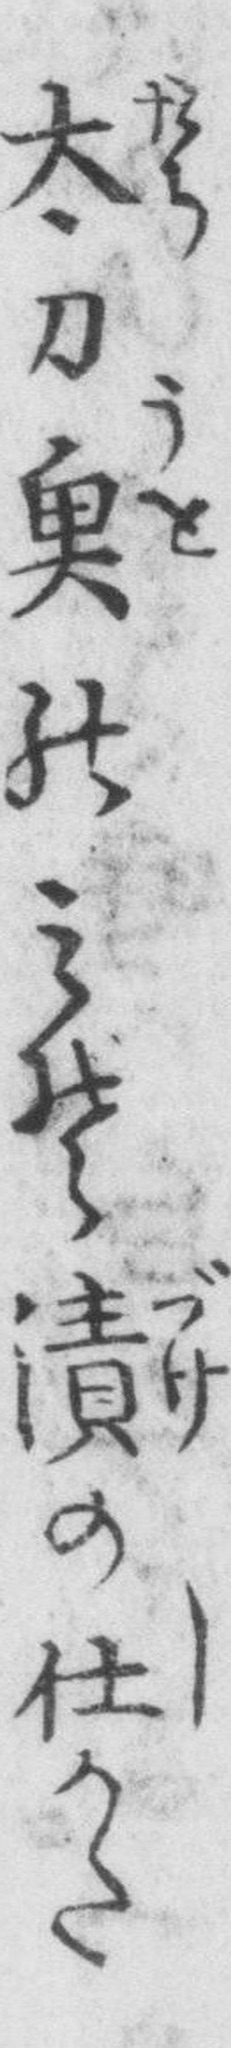太刀魚のみそ漬の仕かた
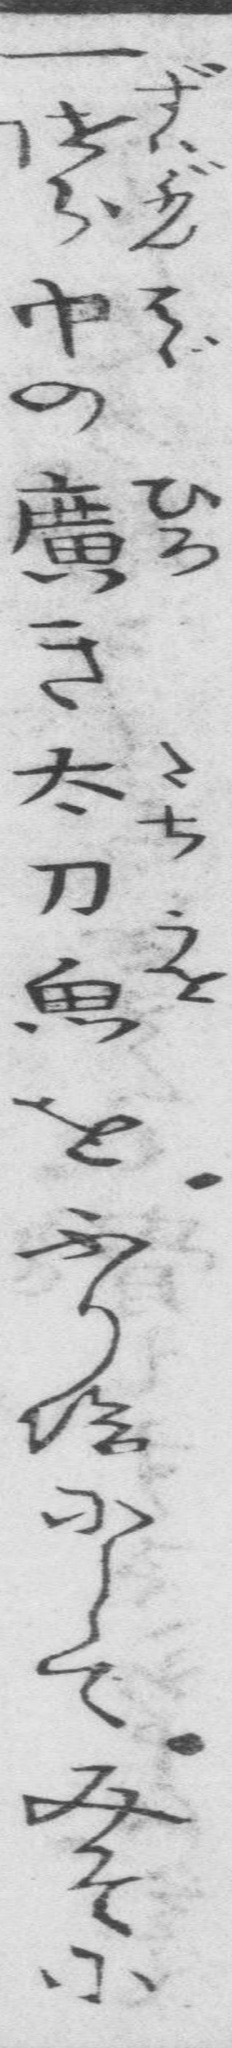一随分巾の広き太刀魚を。ふり塩にして。みそに
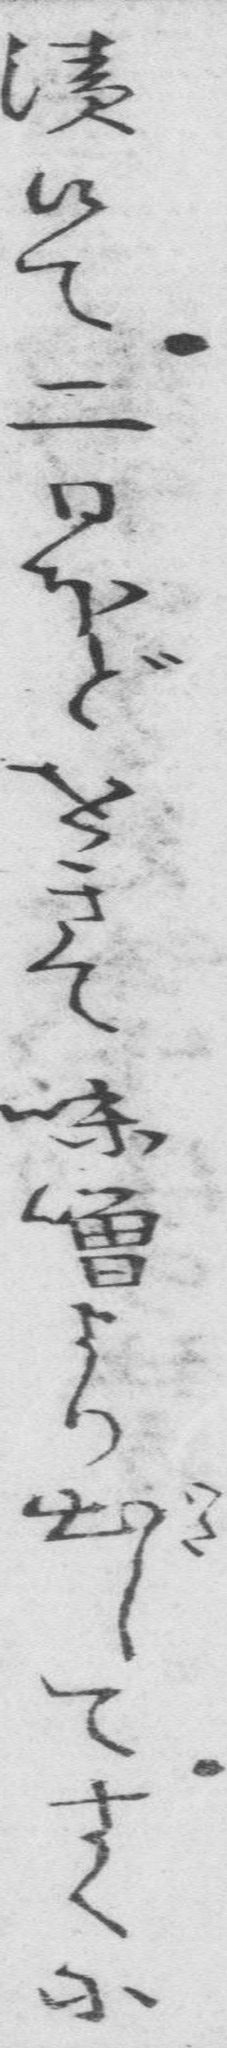漬候て。二日ほどをきて味噌より出して。すくに
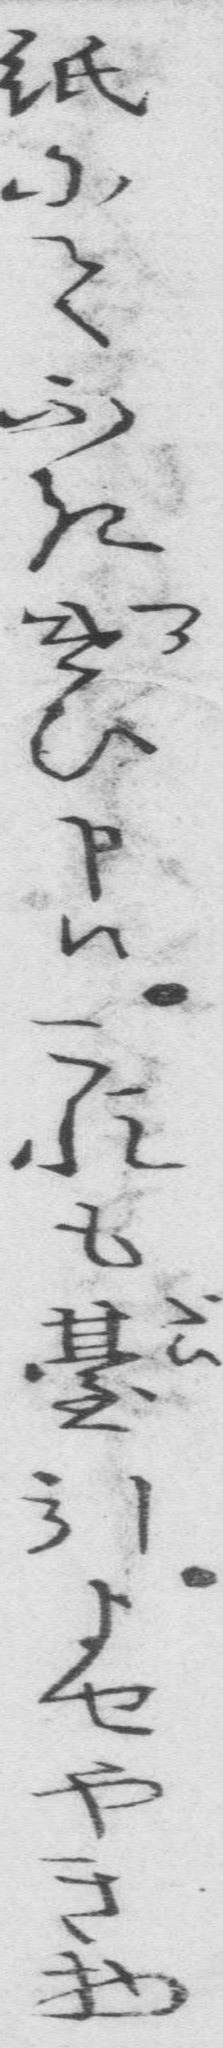紙にてふき遣ひ申候。これも台引。よせやき物
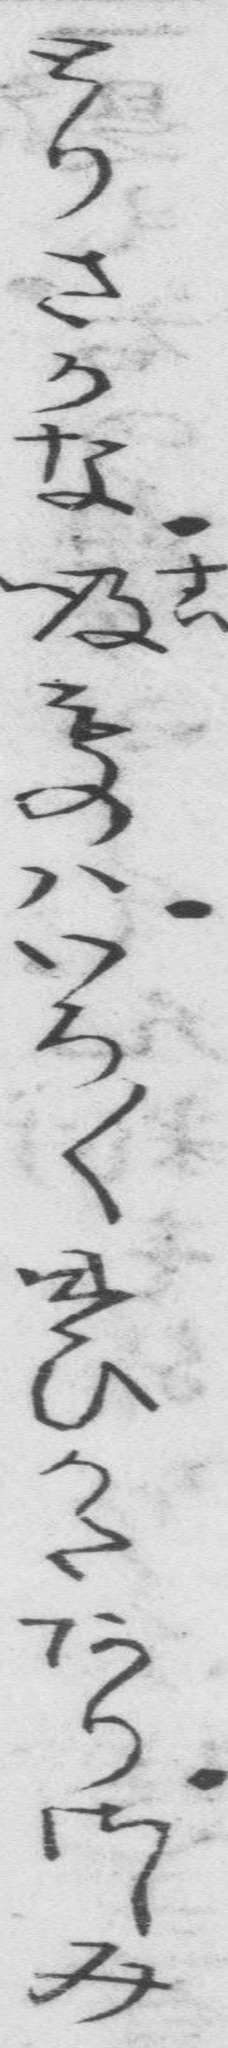とりさかな。吸ものは。いろ〳〵遣ひかたあり。さしみ
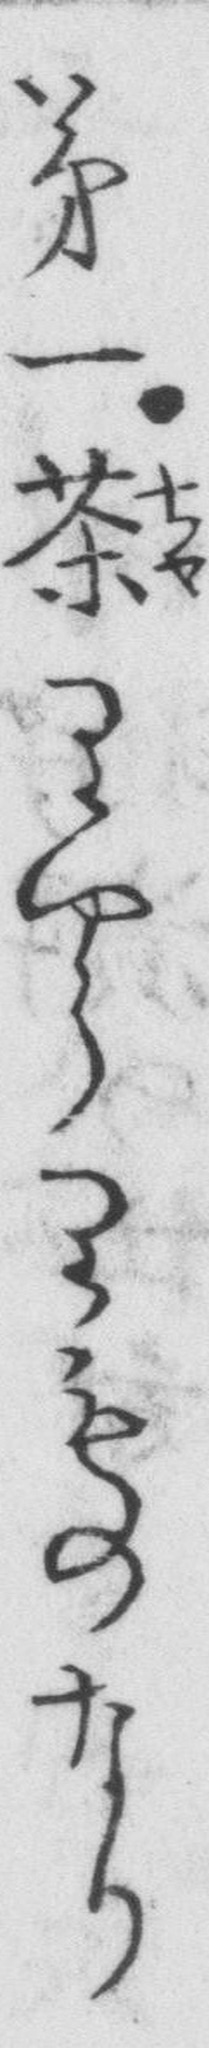第一。茶りやうりものなり
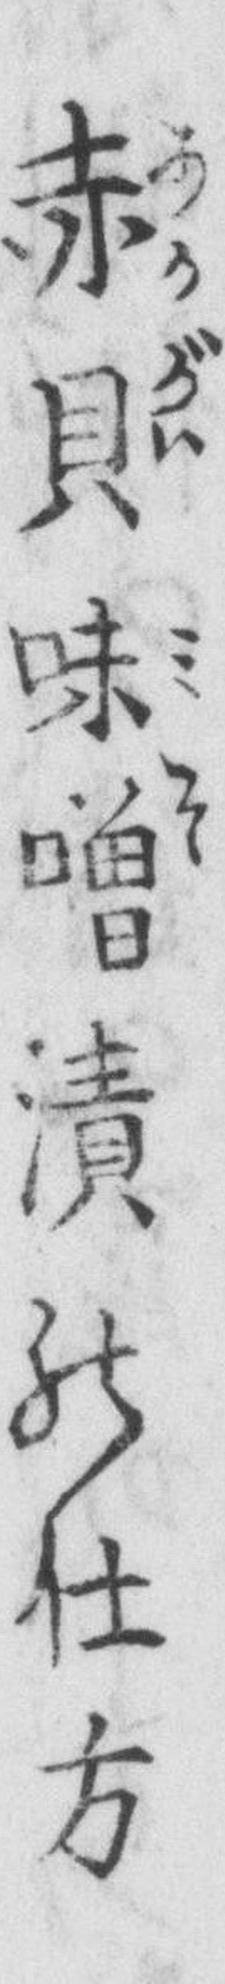赤貝味噌漬の仕方
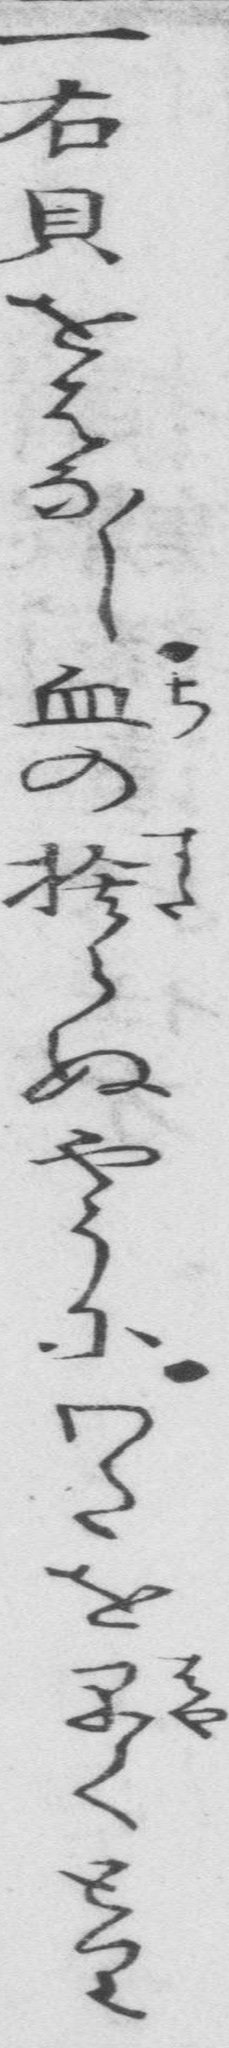一右貝をはなし。血の捨らぬやうに。わたを早くとり
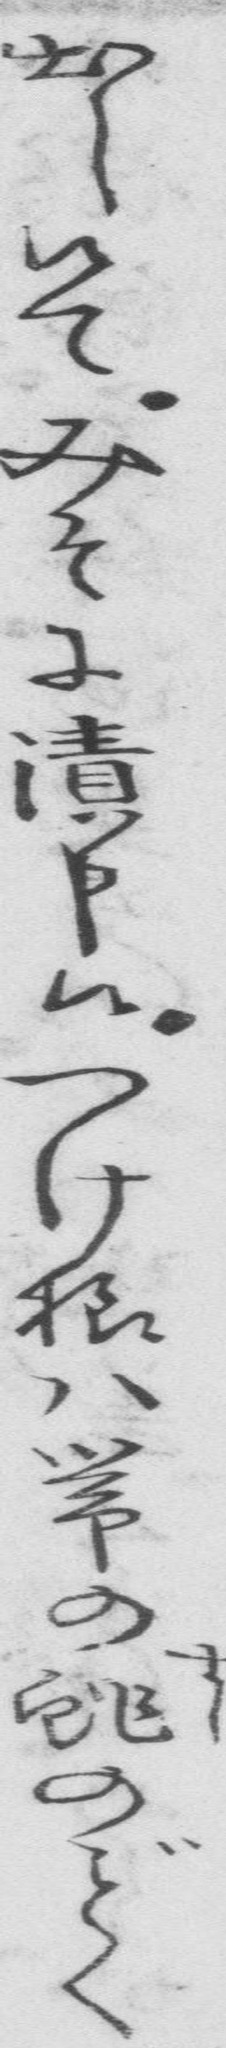出し候て。みそに漬申候。つけ様は常の鮓のごとく
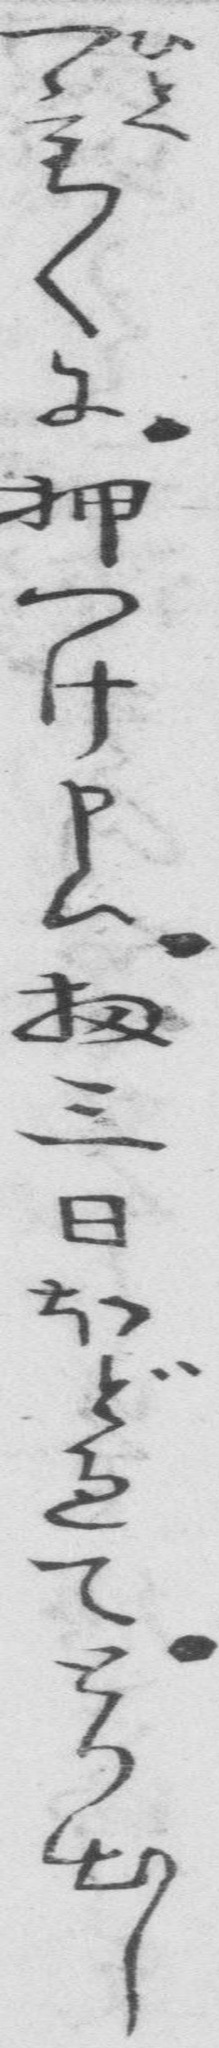一重〳〵に。押つけ申候。扨三日ほど過て。とり出し
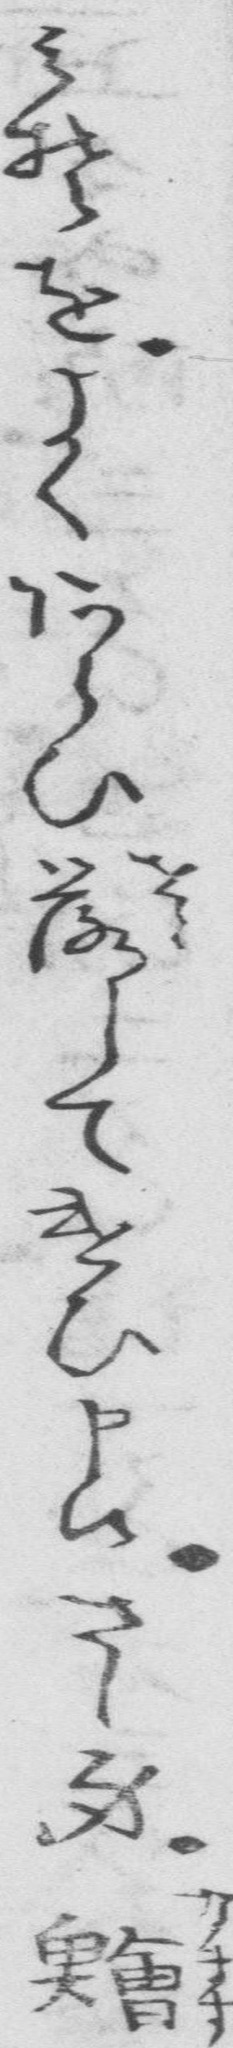みそを。よくあらひ落して遣ひ申候。さし身。鱠
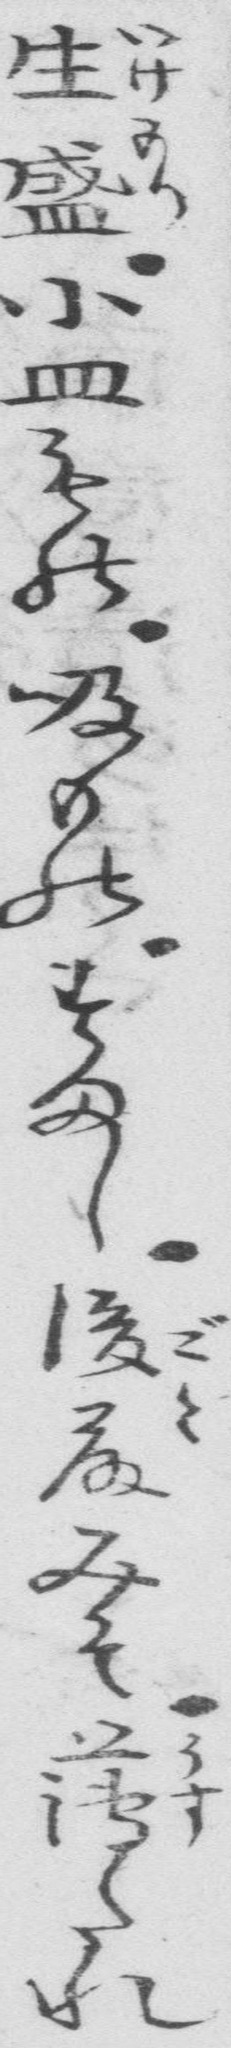生盛。小皿もの。吸もの。すまし。後藤みそ。薄たれ
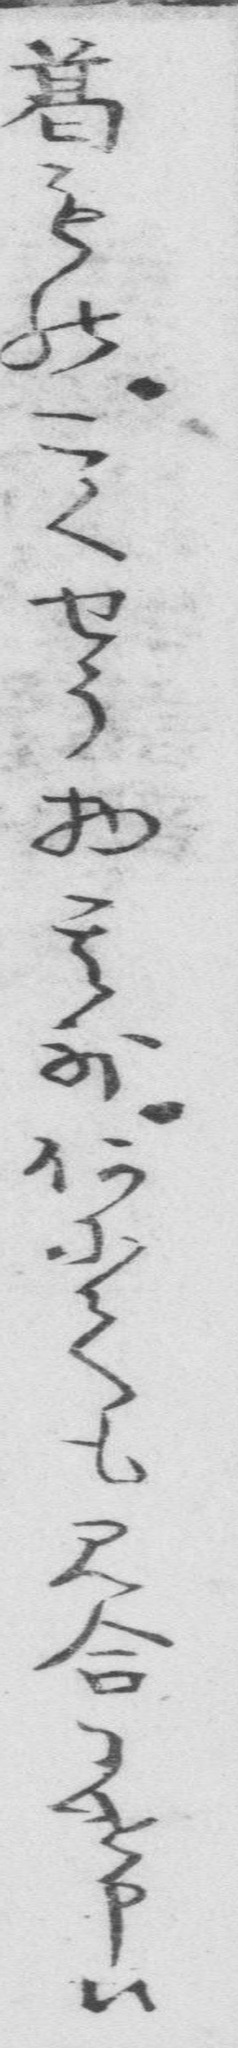葛もの。こくせう物其外。何にても見合に遣申候
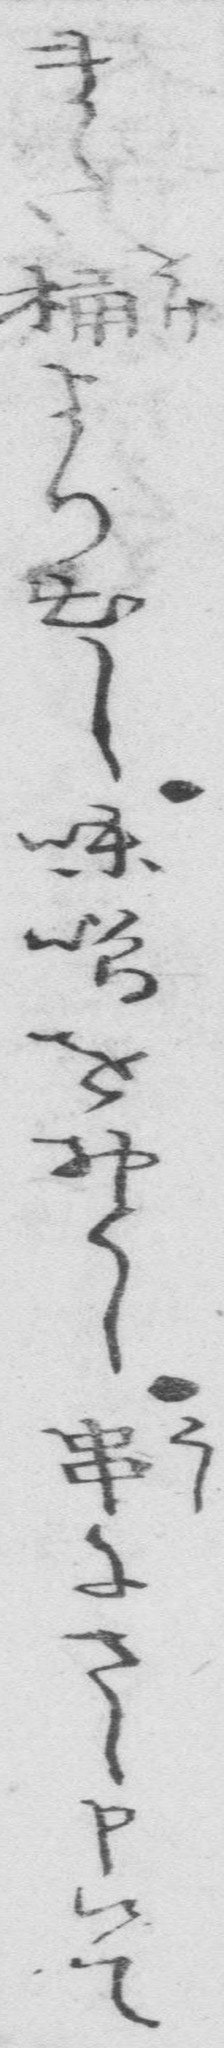また桶より出し。味噌をおとし。串にさし申候て
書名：萬寳料理秘密箱
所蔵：大阪府立大学学術情報センター 国文学研究資料館
